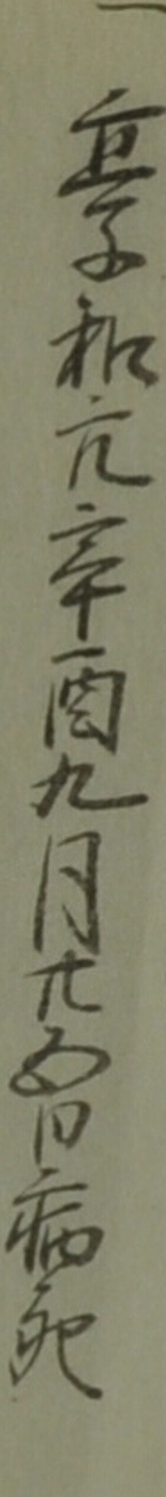一享和元辛酉九月廿五日病死
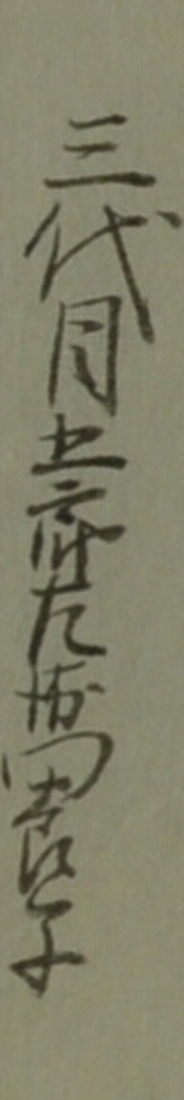三代目五郎左衛門養子
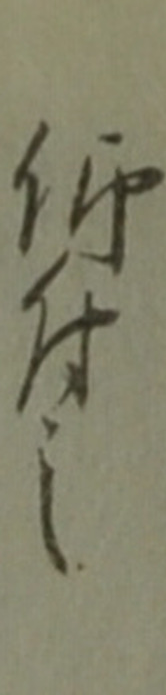仰付之
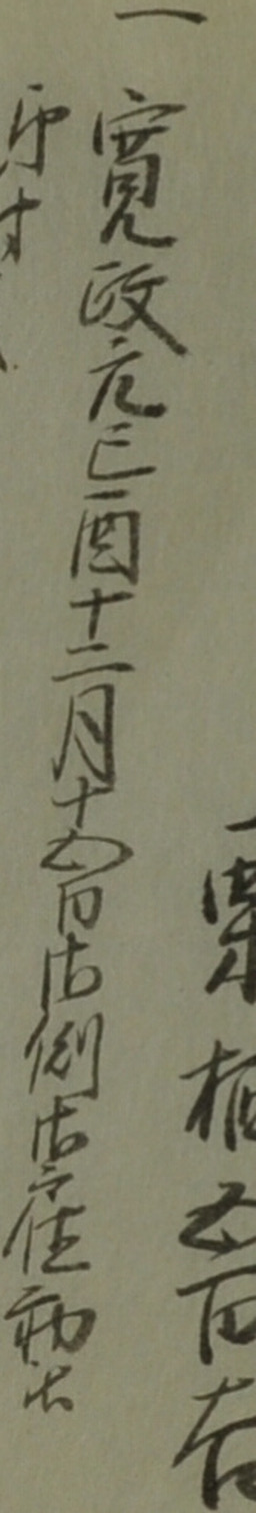一寛政元己酉十二月十五日御側御雇勤被
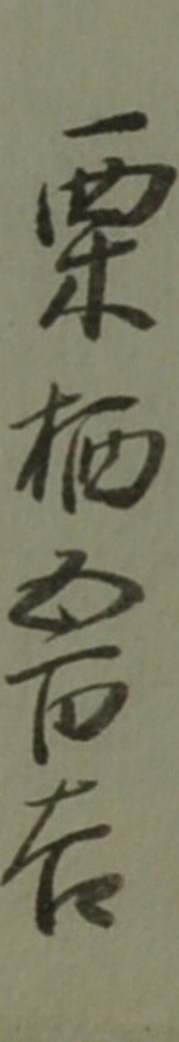栗栖五百吉
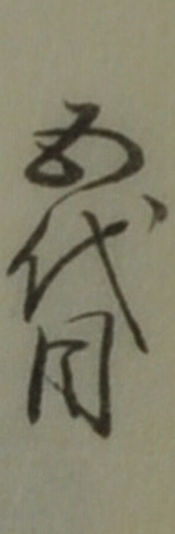五代目
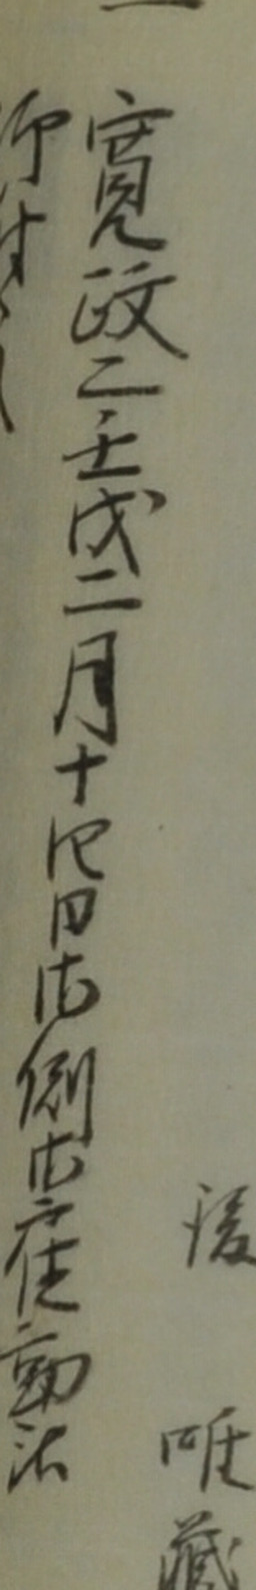一寛政二壬戌二月十四日御側御雇勤被
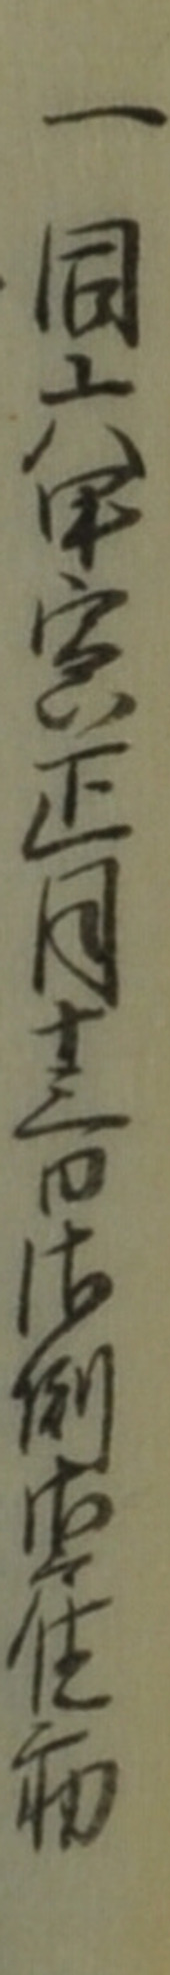一同六甲寅正月十三日御側御雇勤
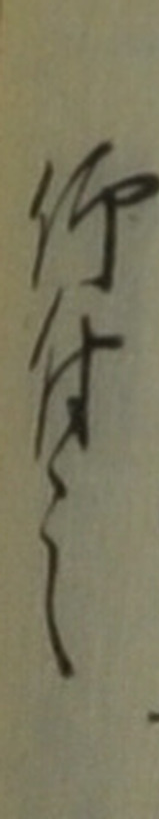仰付之
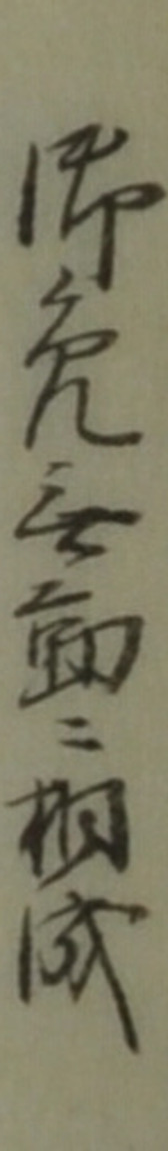御免無勤二相成
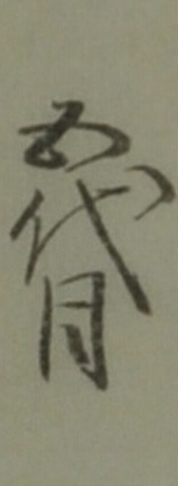五代目
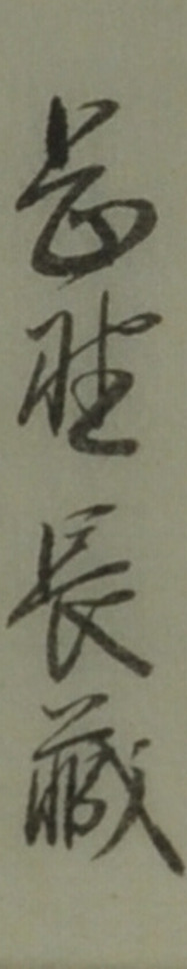岡野長蔵
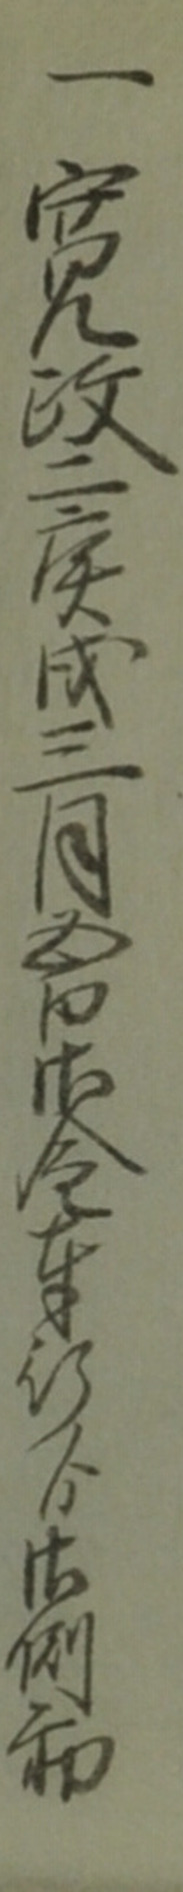一寛政二庚戌三月五日御金奉行ゟ御側勤
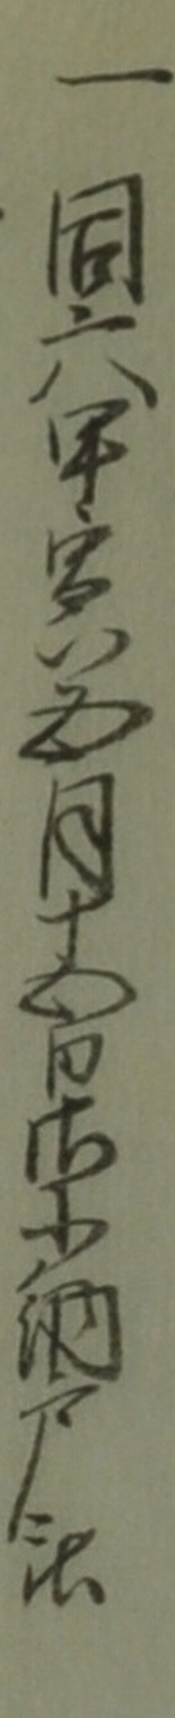一同六甲寅五月十五日御小納戸被
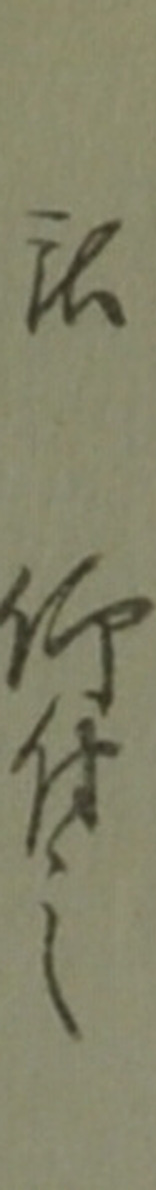被仰付之
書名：諸御役代々録（五）
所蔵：伊那市立高遠町図書館・合同会社AMANE
